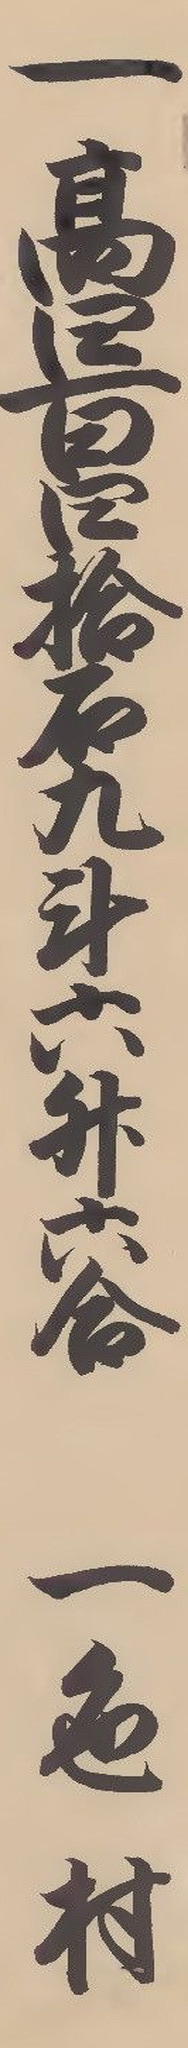一高四百四拾石九斗六升六合一色村
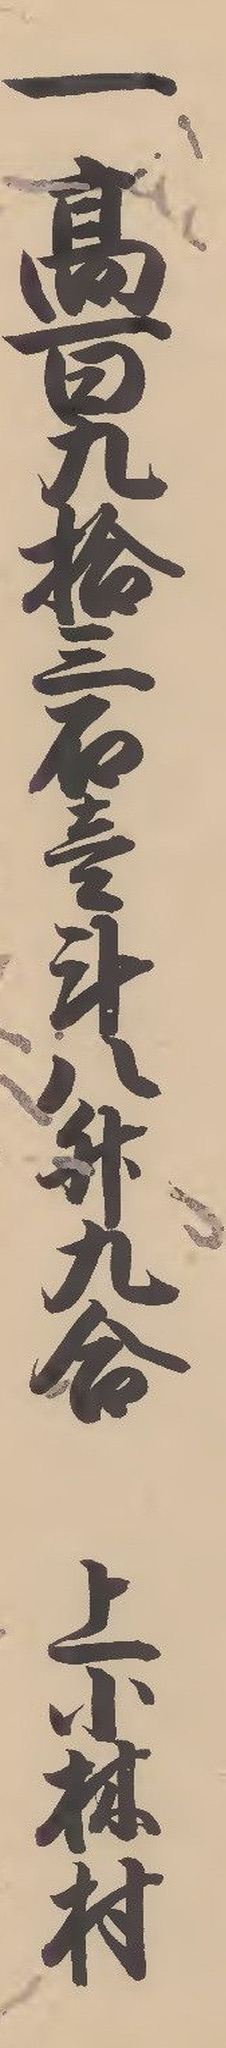一高百九拾三石壱斗八升九合上小林村

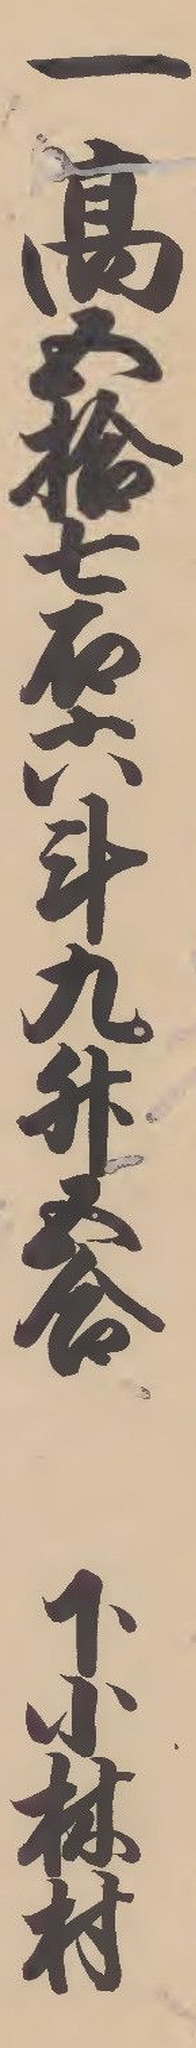一高五拾七石六斗九升五合下小林村
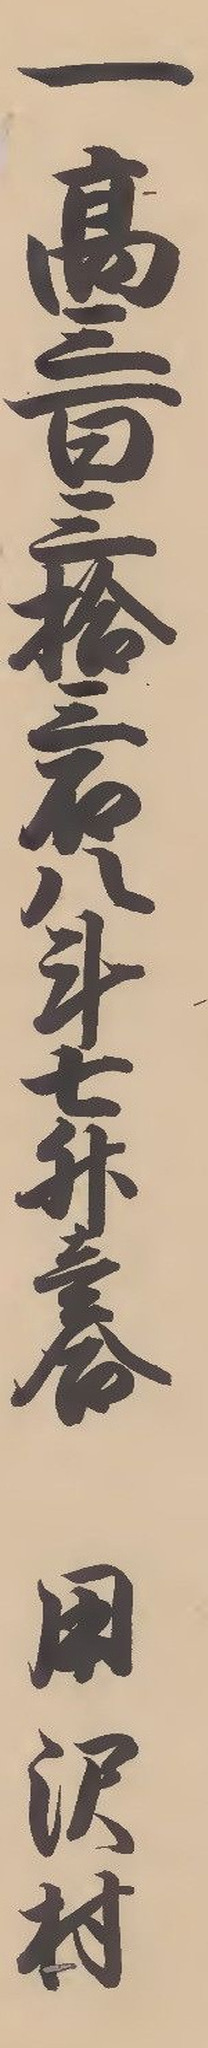一高三百三拾三石八斗七升壱合用沢村
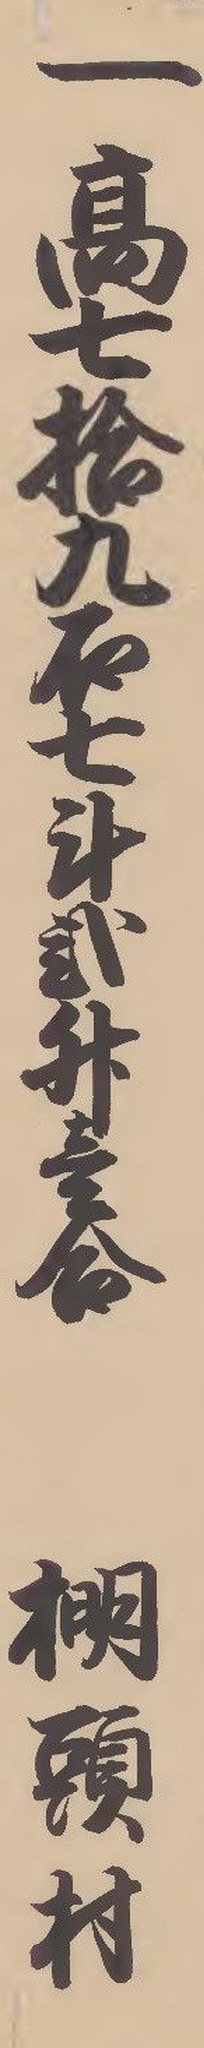一高七拾九石七斗弐升壱合棚頭村
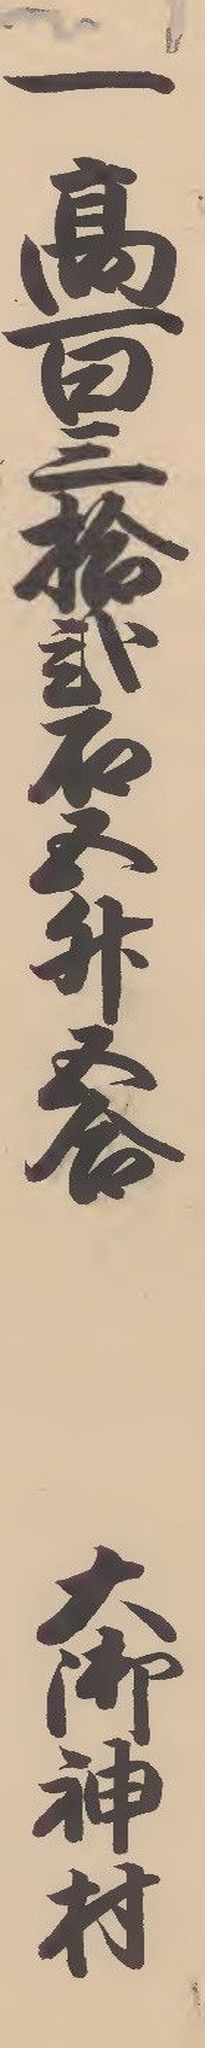一高百三拾弐石五升五合大御神村
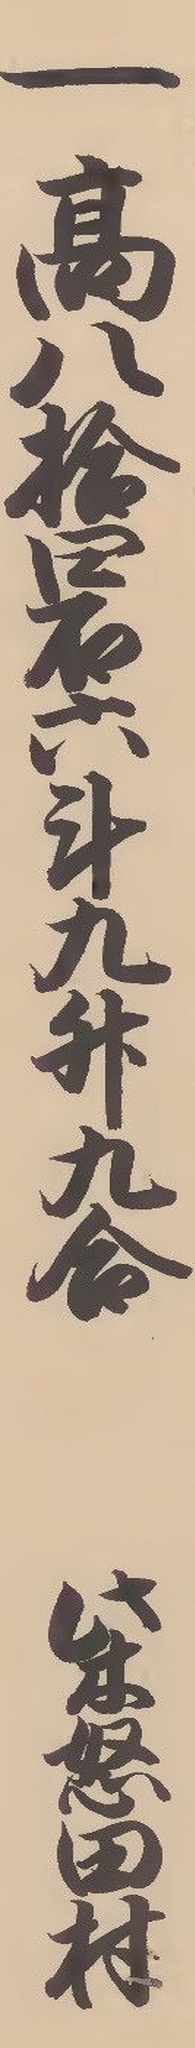一高八拾四石六斗九升九合柴怒田村
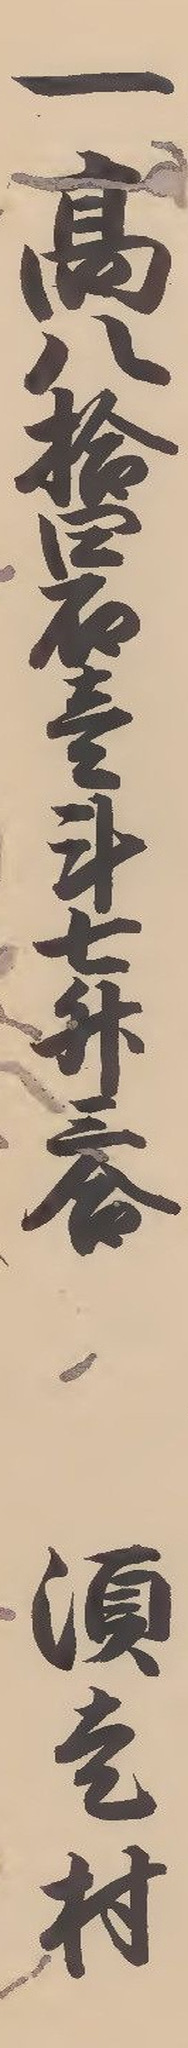一高八拾四石壱斗七升三合須走村

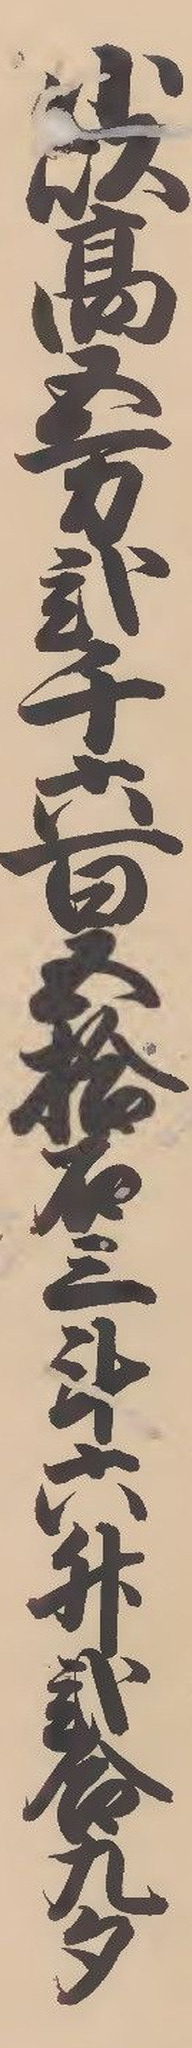小以高五万弐千六百五拾石三斗六升弐合九勺
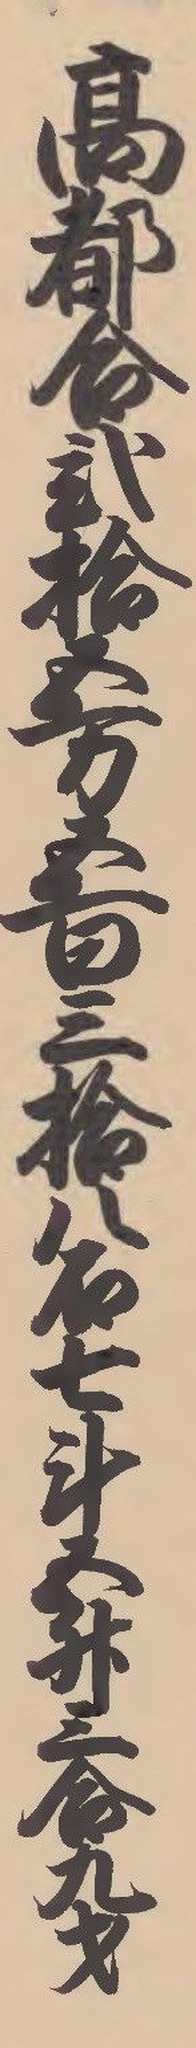高都合弐拾五万五百三拾八石七斗五升三合九才
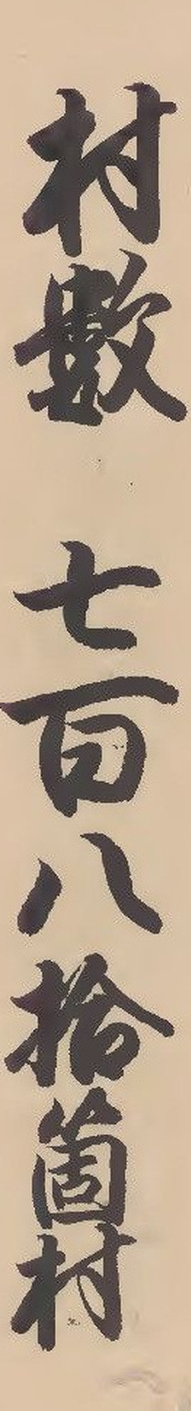村数七百八拾箇村
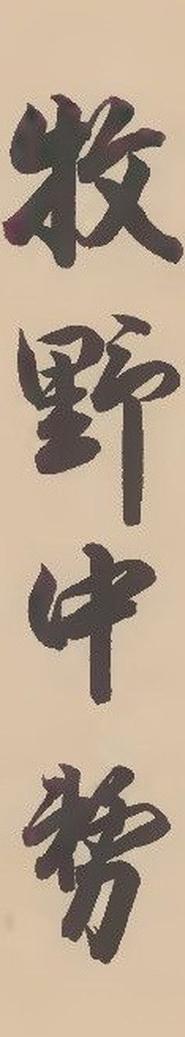牧野中務
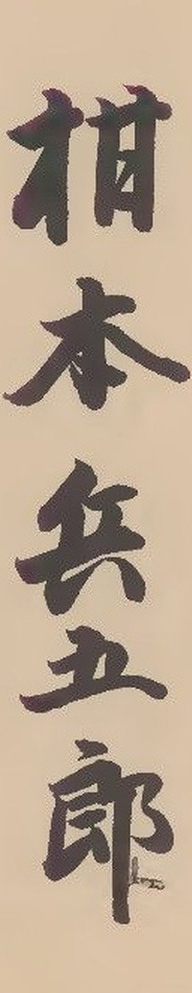柑本兵五郎
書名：駿河国郷帳
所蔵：国立公文書館 National Archives of Japan
